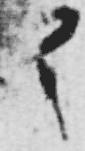女（如）
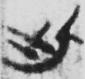此
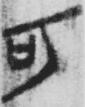可（何）
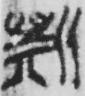斯
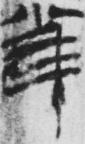雀（誚）
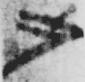之
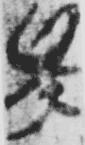矣
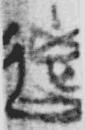○（离）
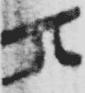亓（其）
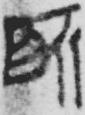所
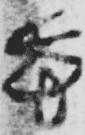○（愛）
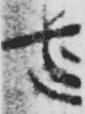必
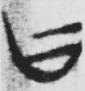曰
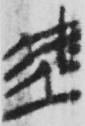○（吾）
